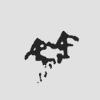築
